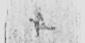十
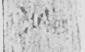五
